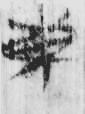東
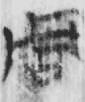周
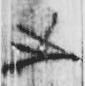之
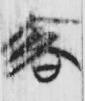客
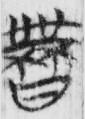○（許）
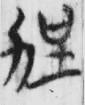○（盈）
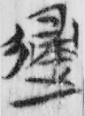歸
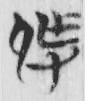{尸拃}（胙）
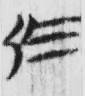於
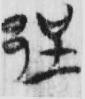郢
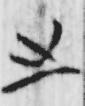之
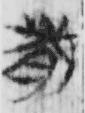歲（歲）
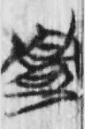○（夏）
